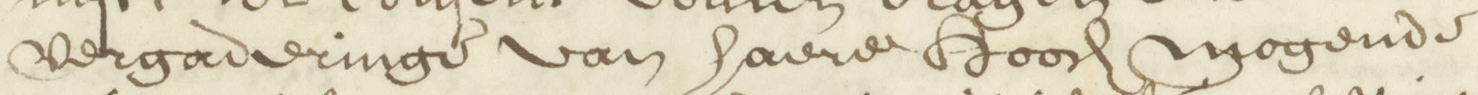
Vergaderinge van haere Hooch Mogende
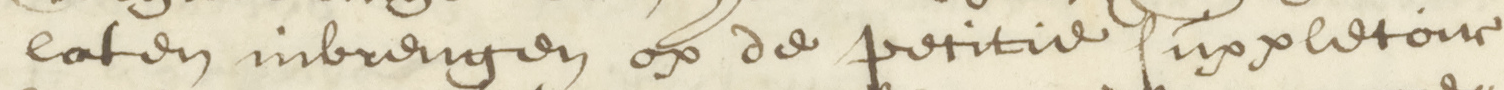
laten inbrengen op de petitie suppletoir
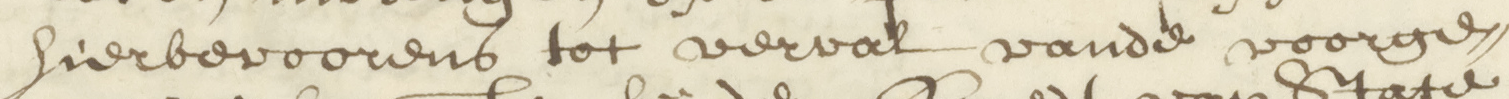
hierbevoorens tot verval vande voorge„
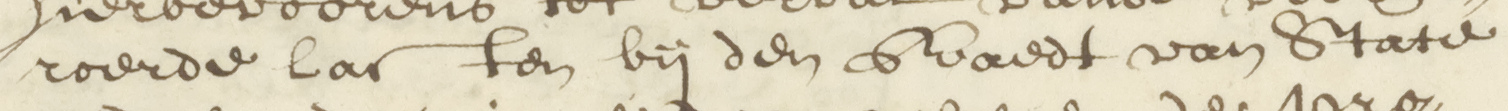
roerde lasten bij den Raedt van State
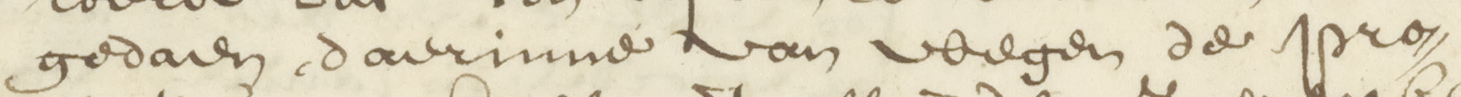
gedaen, daerinne van wegen de Pro„
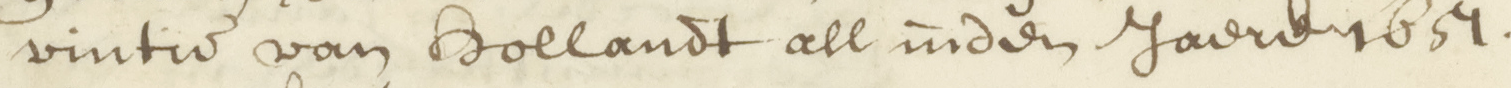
vintie van Hollandt all inden Jaere 1651.
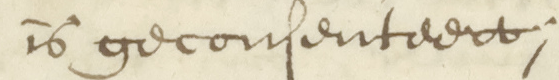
is geconsenteert;
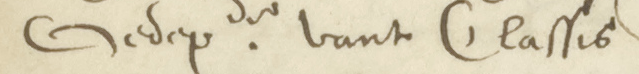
Gedepden. vant Classis
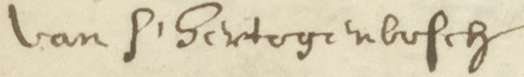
van s'Hertogenbosch
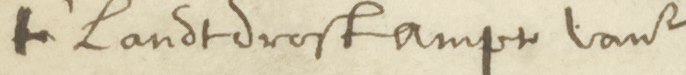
t' Landtdrost Ampt van
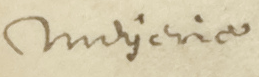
Meijerie
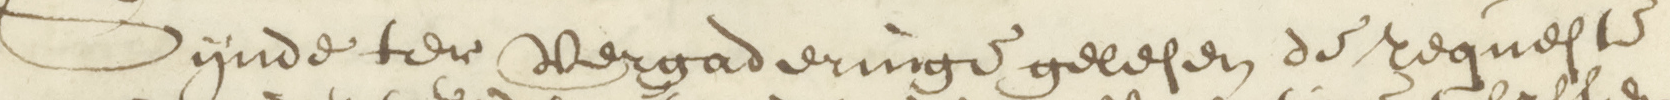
Sijnde ter Vergaderinge gelesen de requeste
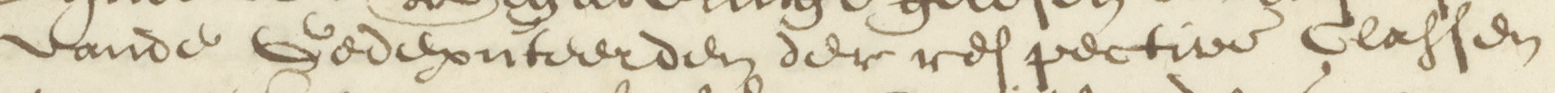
vande Gedeputeerden der respective Classen
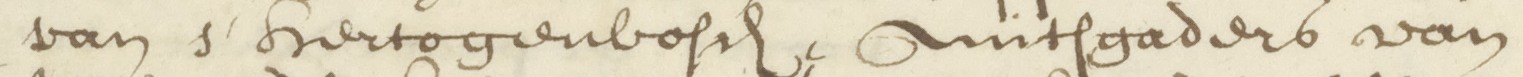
van s'Hertogenbosch Mitsgaders van
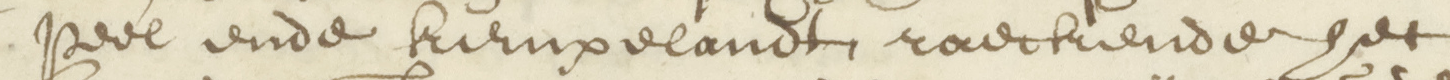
Peel ende Kempelandt, raeckende het
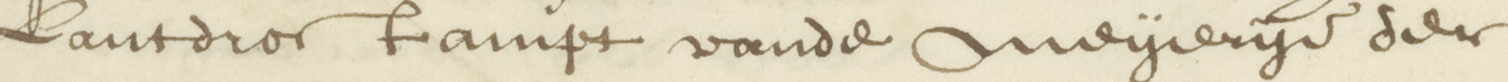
Lantdrost ampt vande Meijerije der
